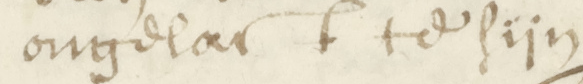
ongelast te sijn.
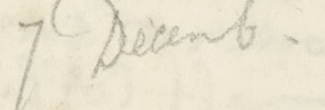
7 Decemb.
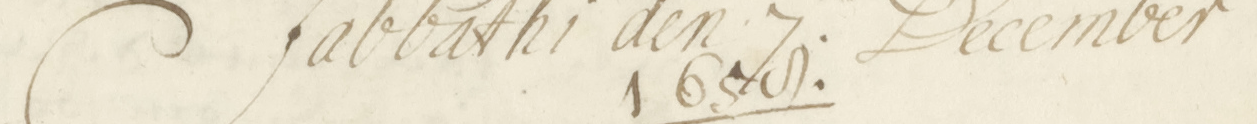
Sabbathi den 7e. December
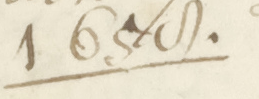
1658.
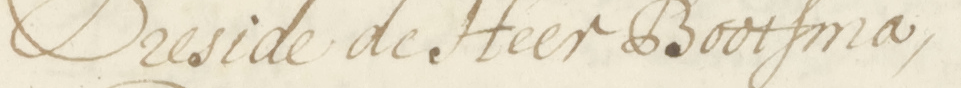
Preside de Heer Bootsma,
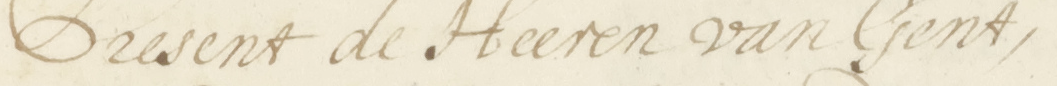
Present de Heeren van Gent,
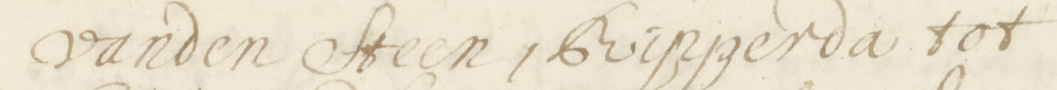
vanden Steen, Ripperda tot
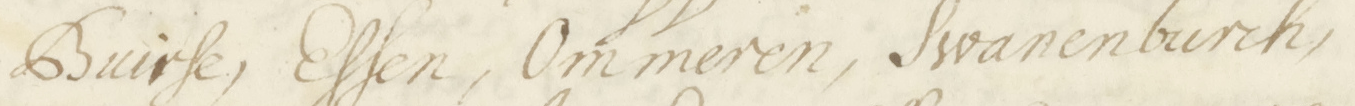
Buirse, Essen, Ommeren, Swanenburch,
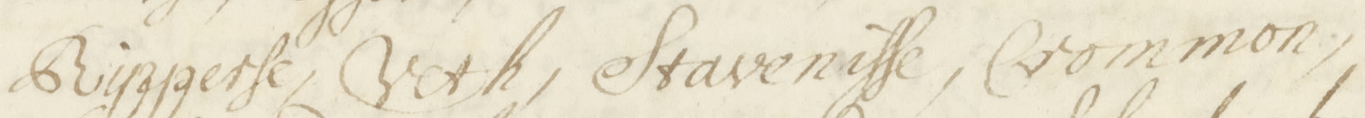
Ripperse, Veth, Stavenisse, Crommon,
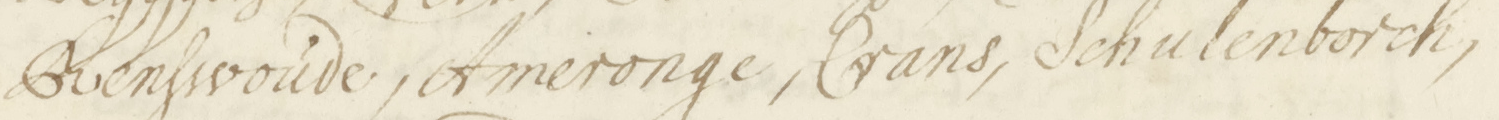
Renswoude, Ameronge, Crans, Schulenborch,
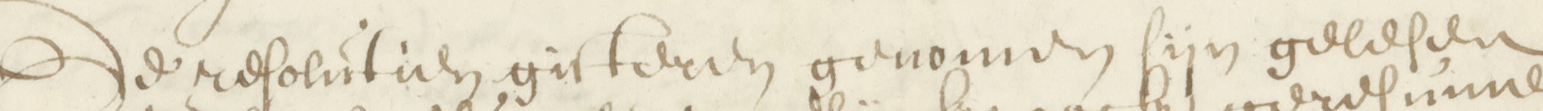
De resolutien gisteren genomen sijn gelesen
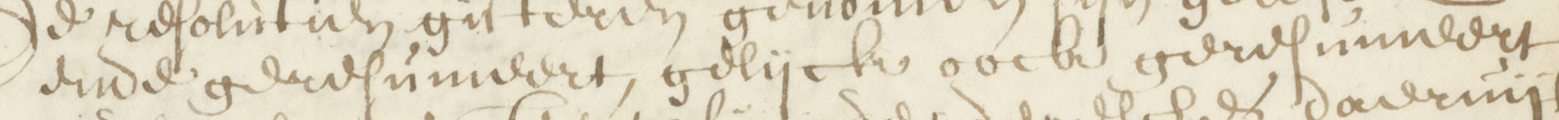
ende geresumeert, gelijck oock geresumeert
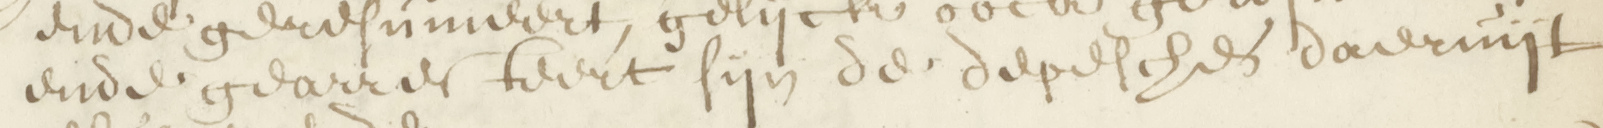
ende gearresteert sijn de depesches daeruijt
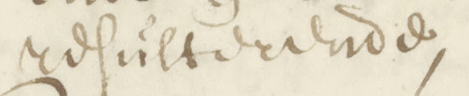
resulterende.
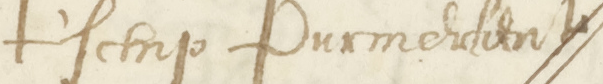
t‛Schip Purmerlent
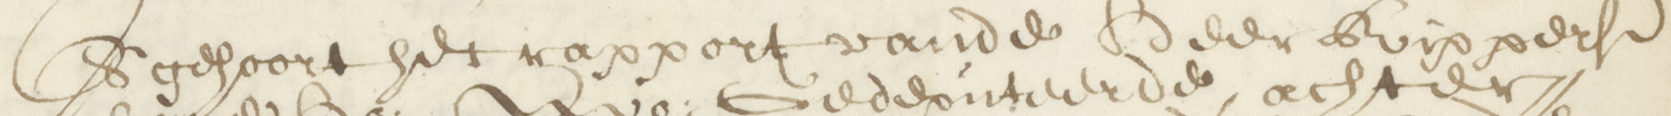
Is gehoort het rapport vande Heer Ripperse
